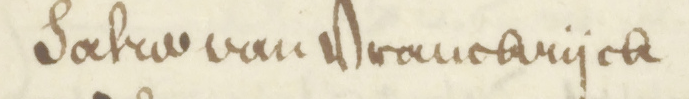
Sake van Vranckrijck
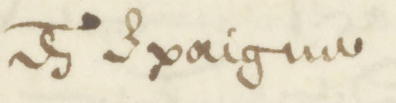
en Spaigne
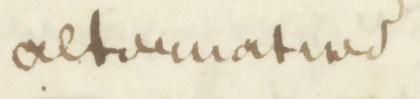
alternative
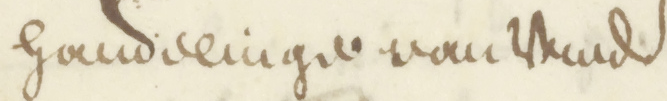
handelinge van Vrede
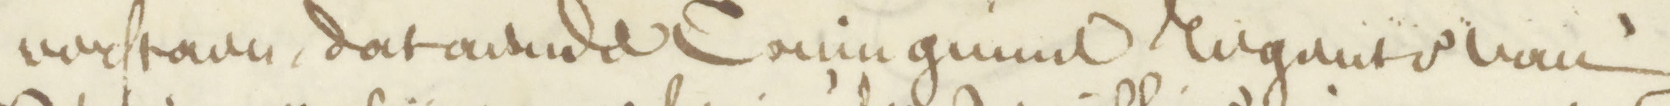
verstaen, dat aende Coninginne Regente van
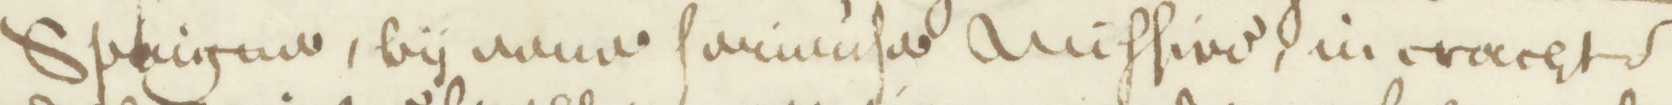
Spaigne, bij eene serieuse Missive, in crachte
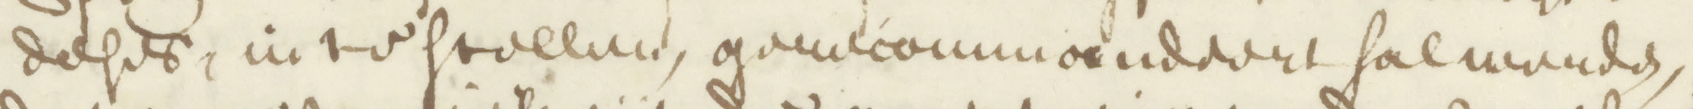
deses, in te stellen, gerecommandeert sal werden,
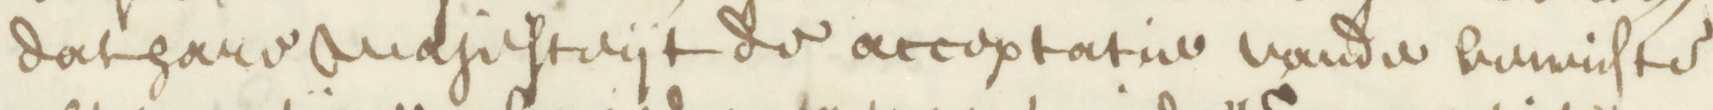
dat hare Majesteijt de acceptatie vande bewuste
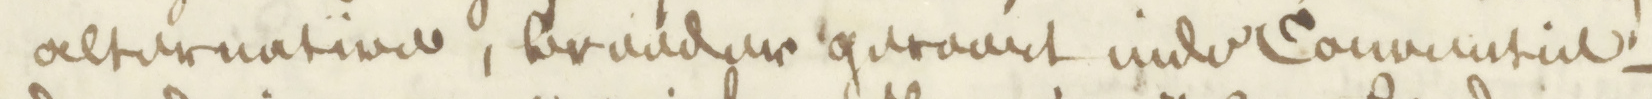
alternative, breeder geroert inde Conventie
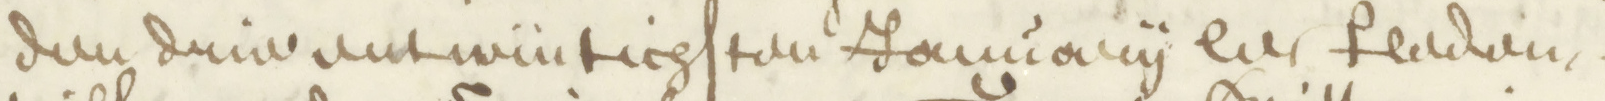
den drie entwintichsten Januarij lestleden,
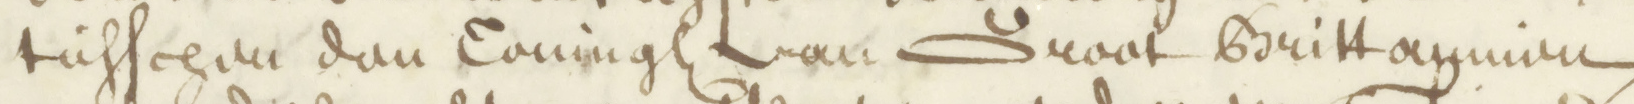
tusschen den Coningh van Groot Brittannien
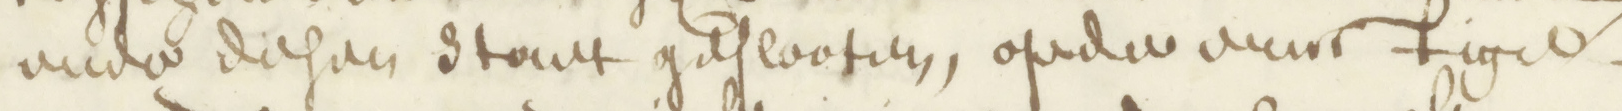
ende desen Staet geslooten, opde ernstige
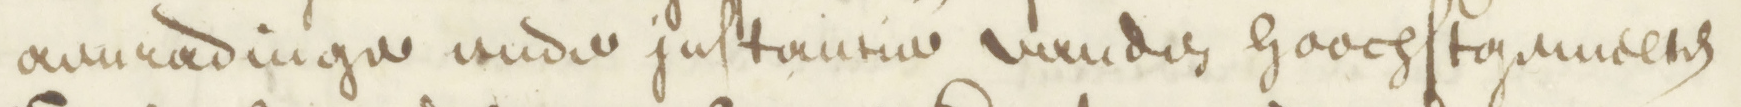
aenradinge ende instantie vanden hoochstgemelten
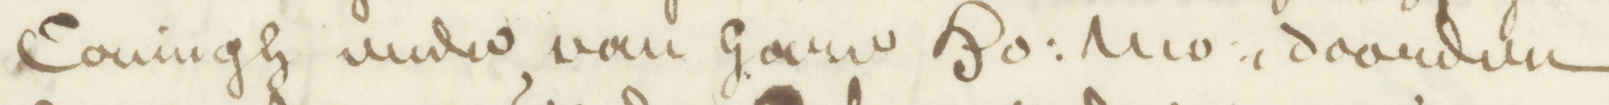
Coningh ende van hare Ho:Mo:, door den
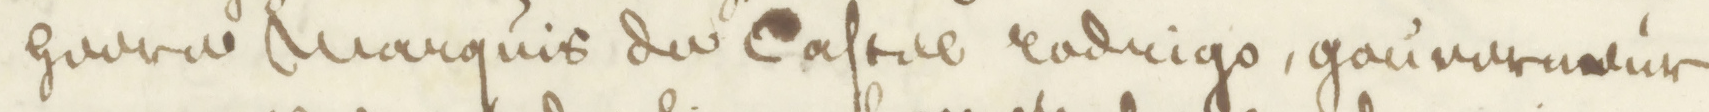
heere Marquis de Castel Rodrigo, gouverneur
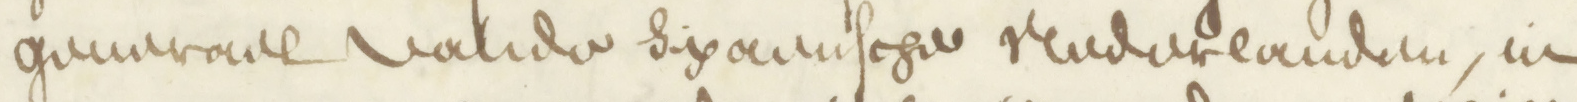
generael vande Spaensche Nederlanden, in
